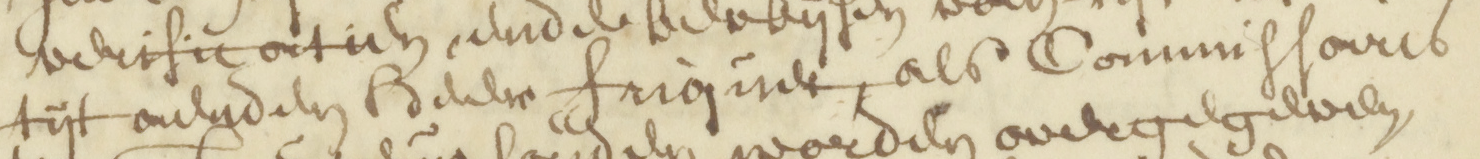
tijt aenden Heer Friquet, als Commissaris
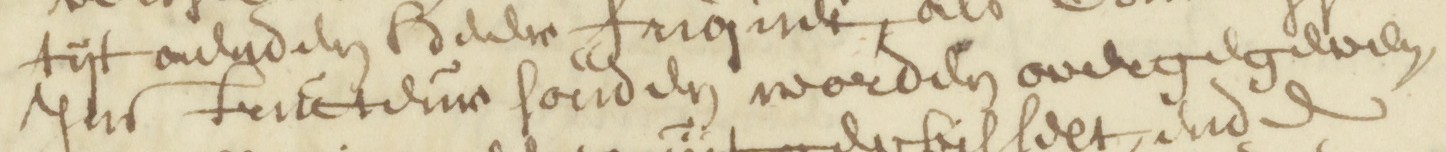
Instructeur souden worden overgegeven,
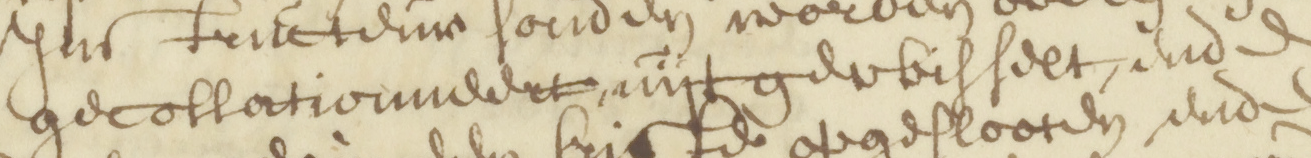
gecollationneert uijtgewisselt, ende
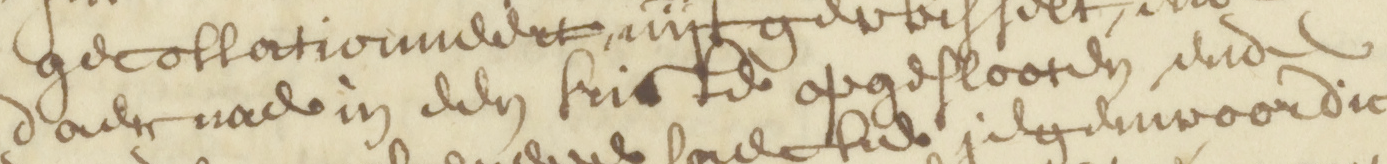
daernae in een kiste opgeslooten ende
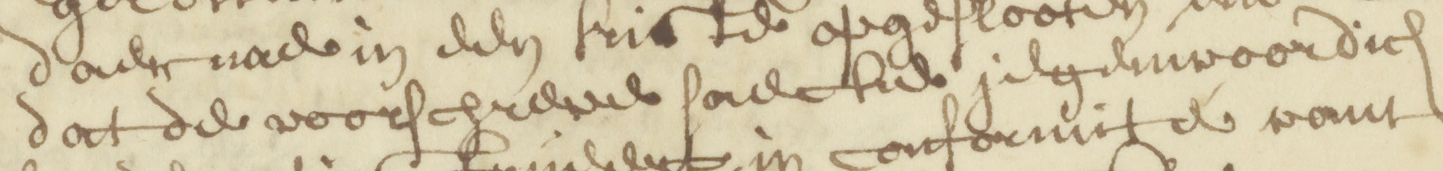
dat de voorschreve saecke jegenwoordich
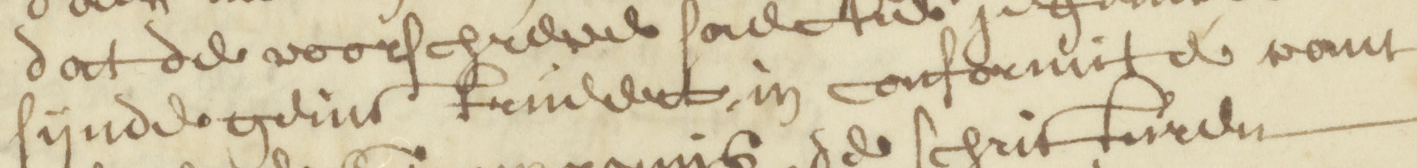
sijnde geinstrueert, in conformité vant
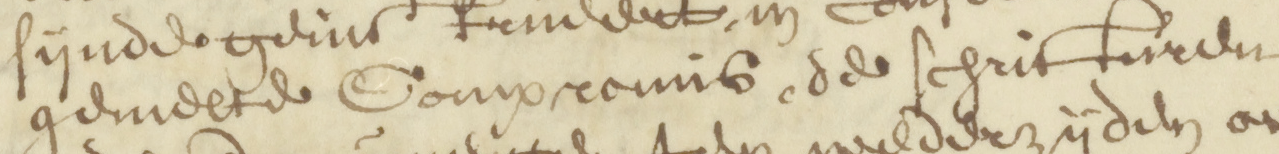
gemelte Compromis, de schrifturen
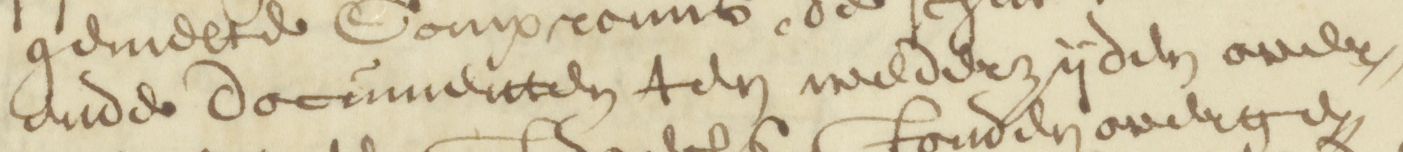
ende documenten ten wederzijden over„
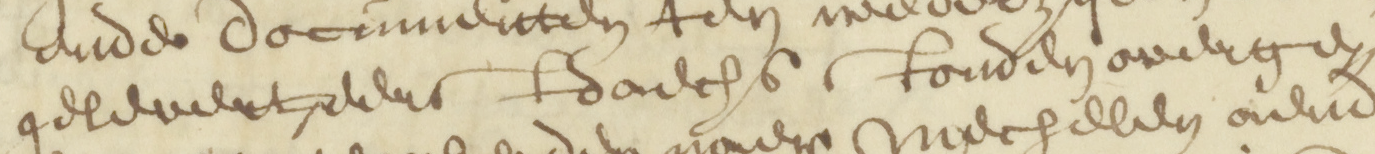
gelevert, eerstdaechs stonden overge„
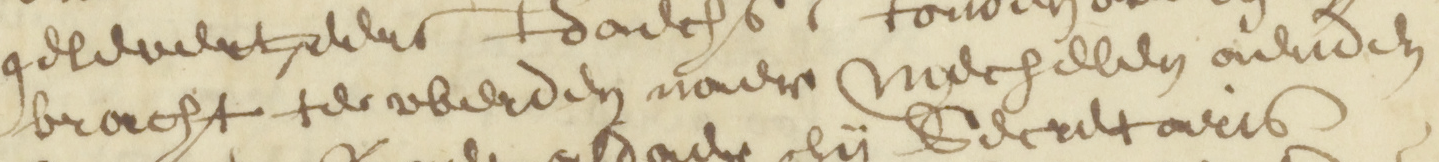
bracht te werden naer Mechelen aenden
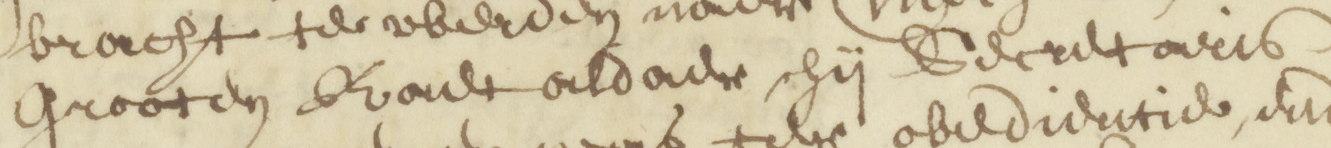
Grooten Raet aldaer, hij Secretaris
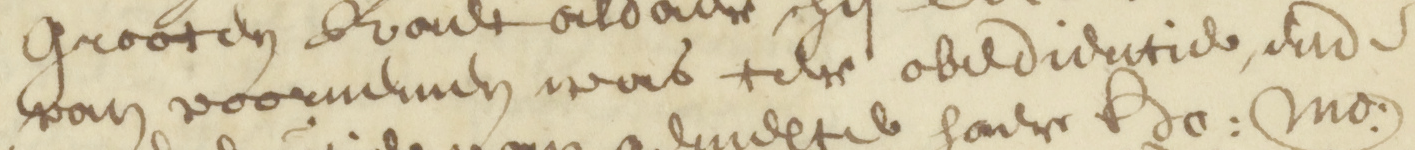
van voornemen was ter obedientie, ende
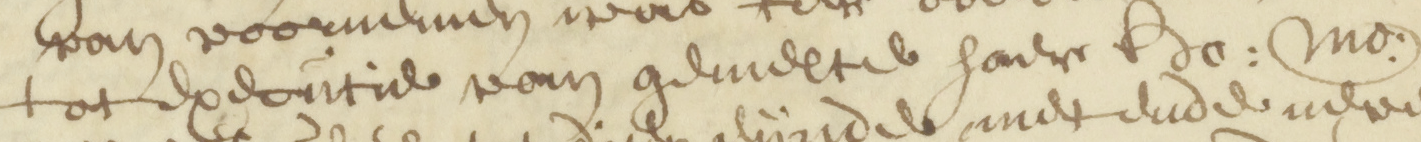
tot executie van gemelte haer Ho:Mo:
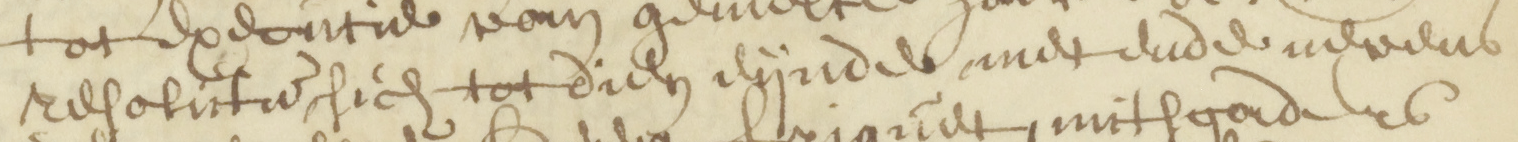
resolutie, sich tot dien eijnde, met ende nevens
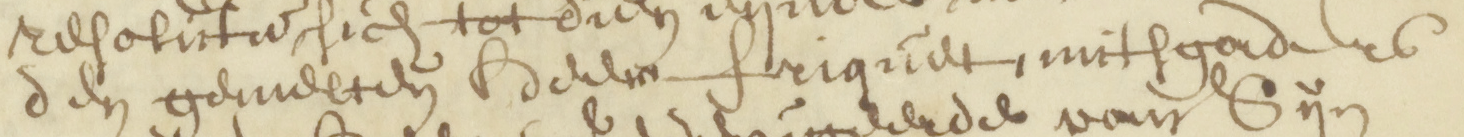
den gemelten Heer Friquet, mitsgaders
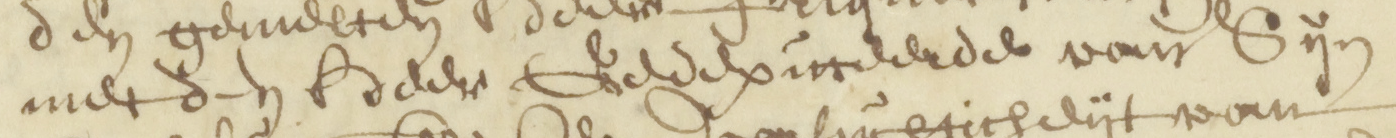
met den Heer Gedeputeerde van Sijn
